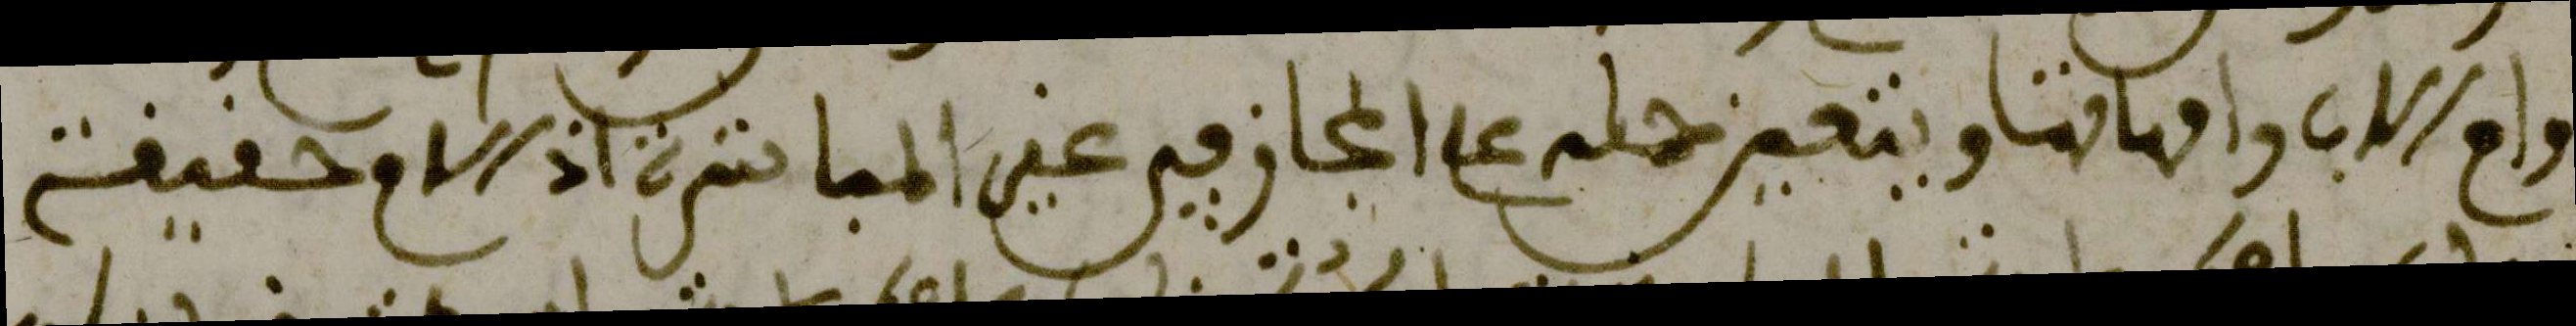وام الاب وامهاتها ويتعني حمله على الحجاز في غير المباشرة اذ الام حقيقة
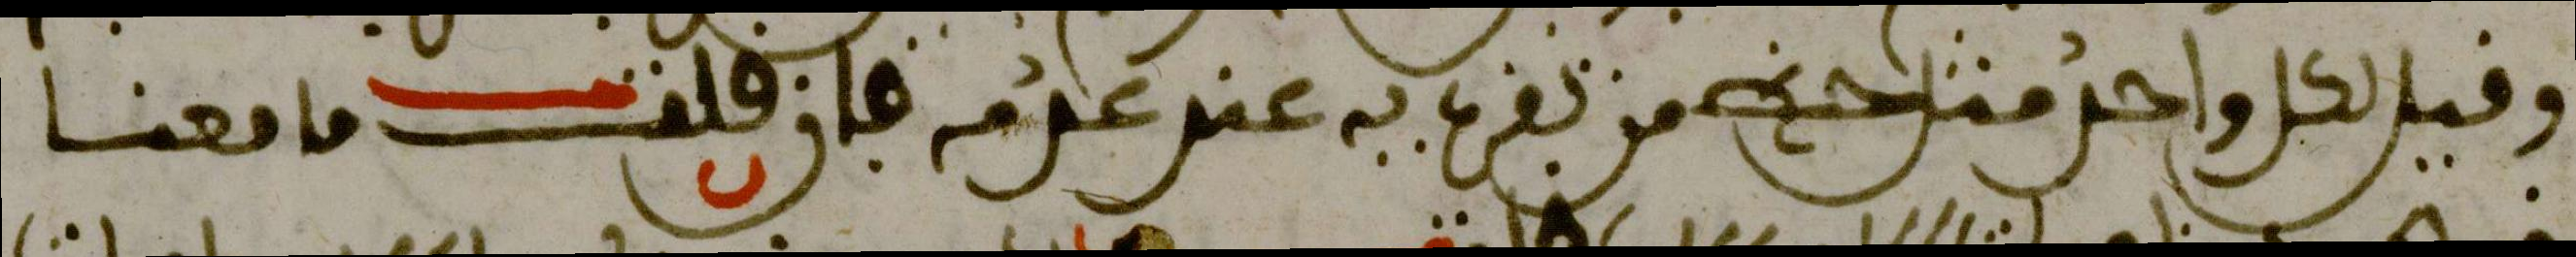وقيل لكل واحد مثل حض من تقرب به عند عدمه فان قلتَ ما معنا
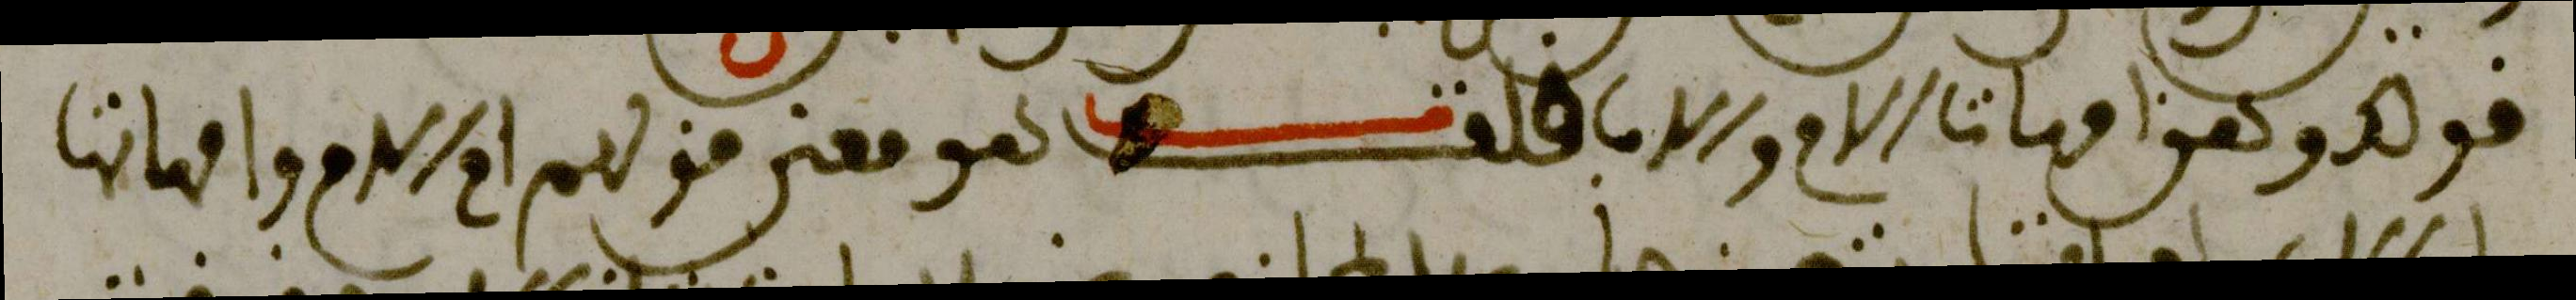قولك وهو امهات الام والاب قلتَ هو معنى قولهم ام الام وامهاتها
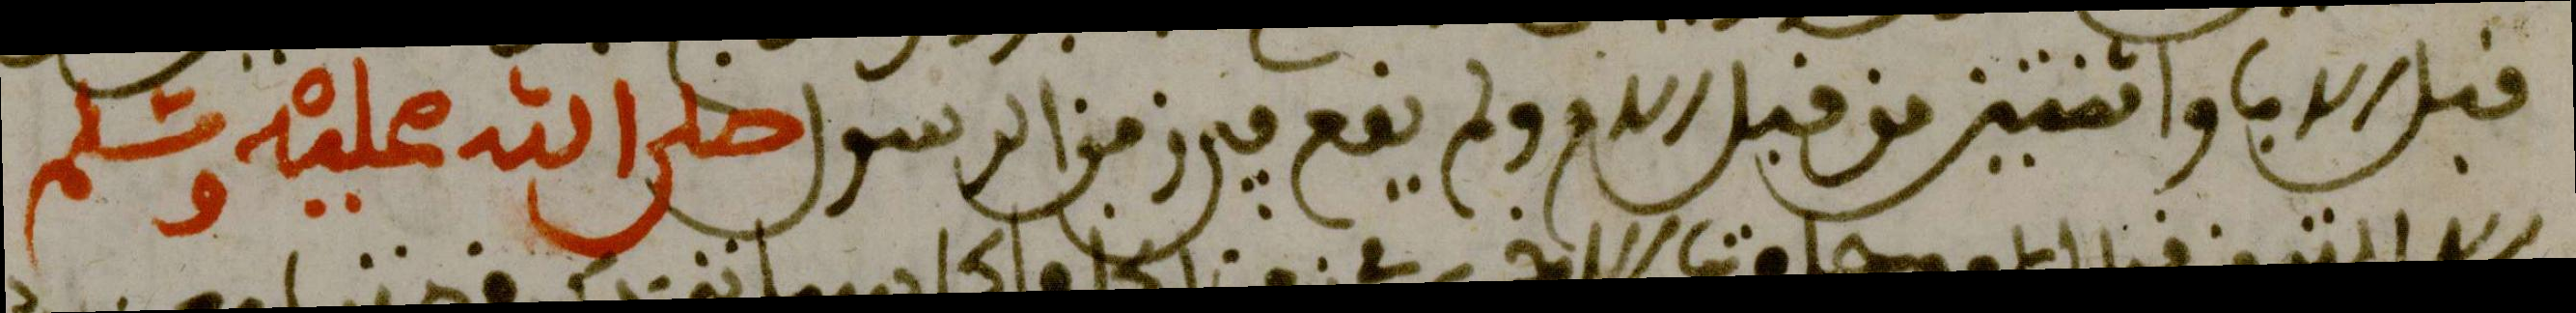قبل الاب واثنين من قبل الام ولم يقع في زمن الرسول صلى الله عليْه وسلم
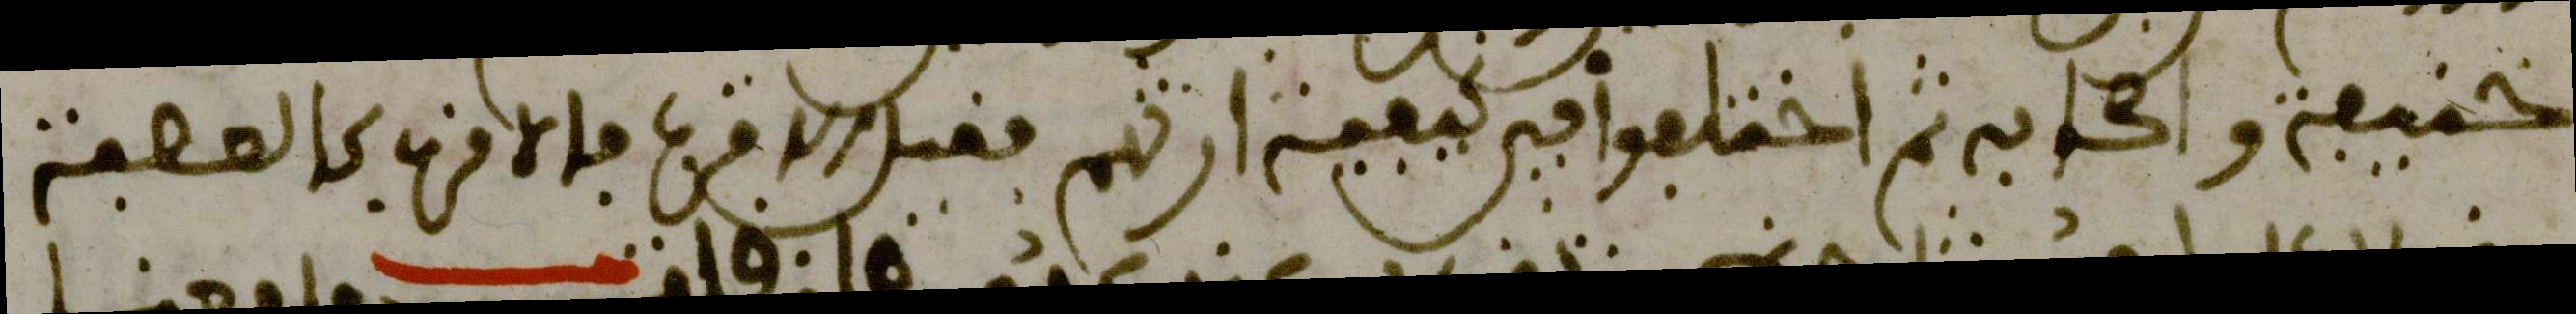حنيفة واصحابه ثم اختلفوا في كيفية ارثهم فقيل الاقرب فالاقرب كالعصبة
